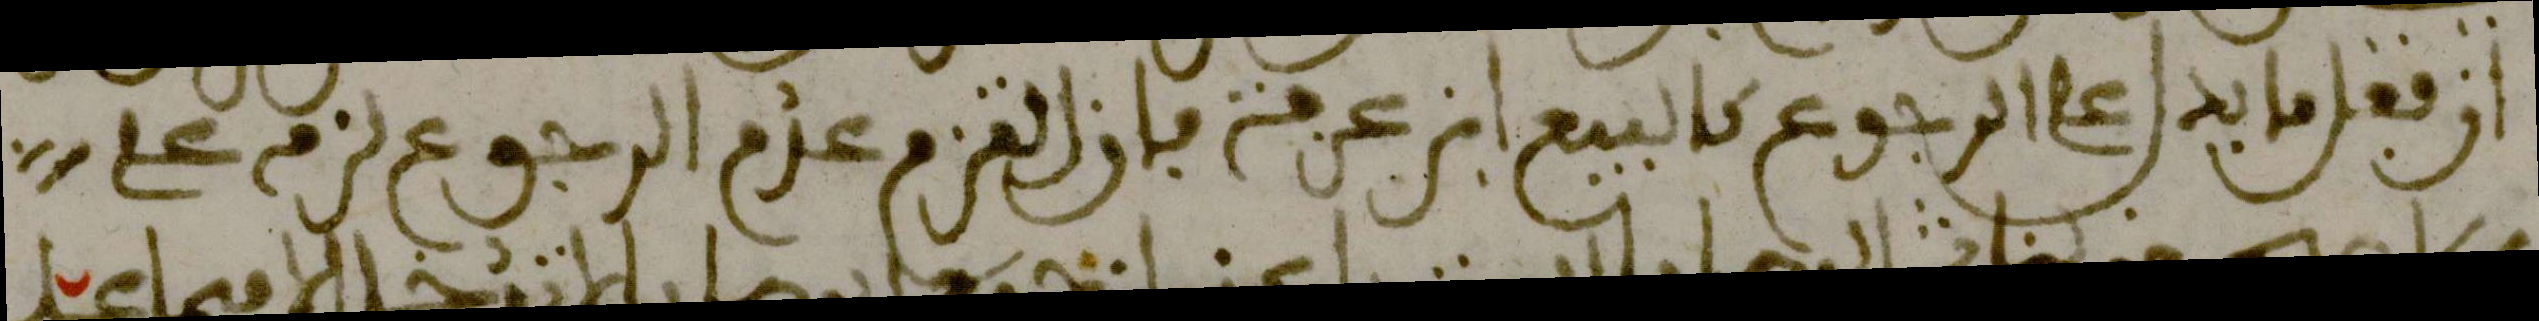ان فعل ما يدل على الرجوع كالبيع لبن عرفة فان التزم عدم الرجوع لزمه على
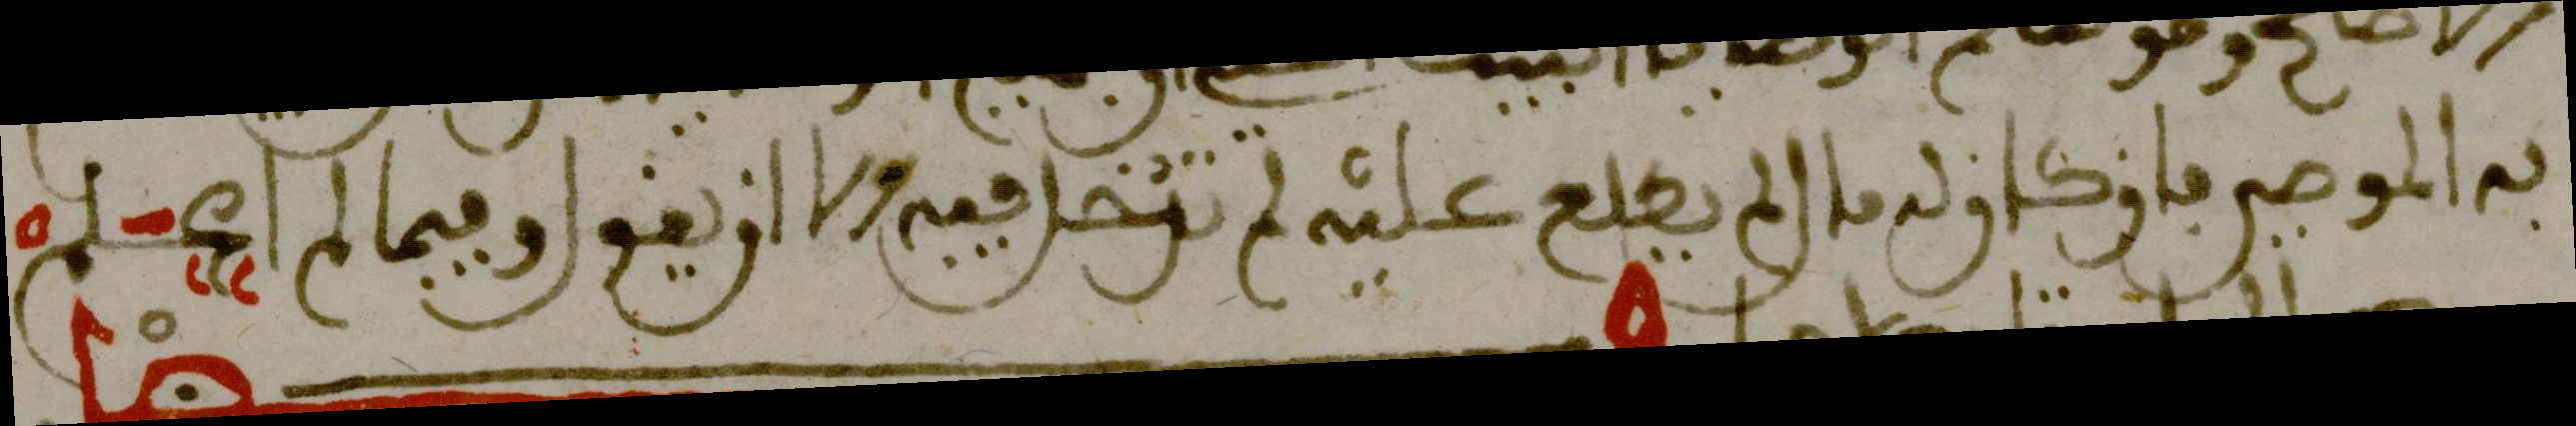به الموصي فان كان له مال لم يطلع عليه لم تدخل فيه الا ان يقول وفيما لم اعلم
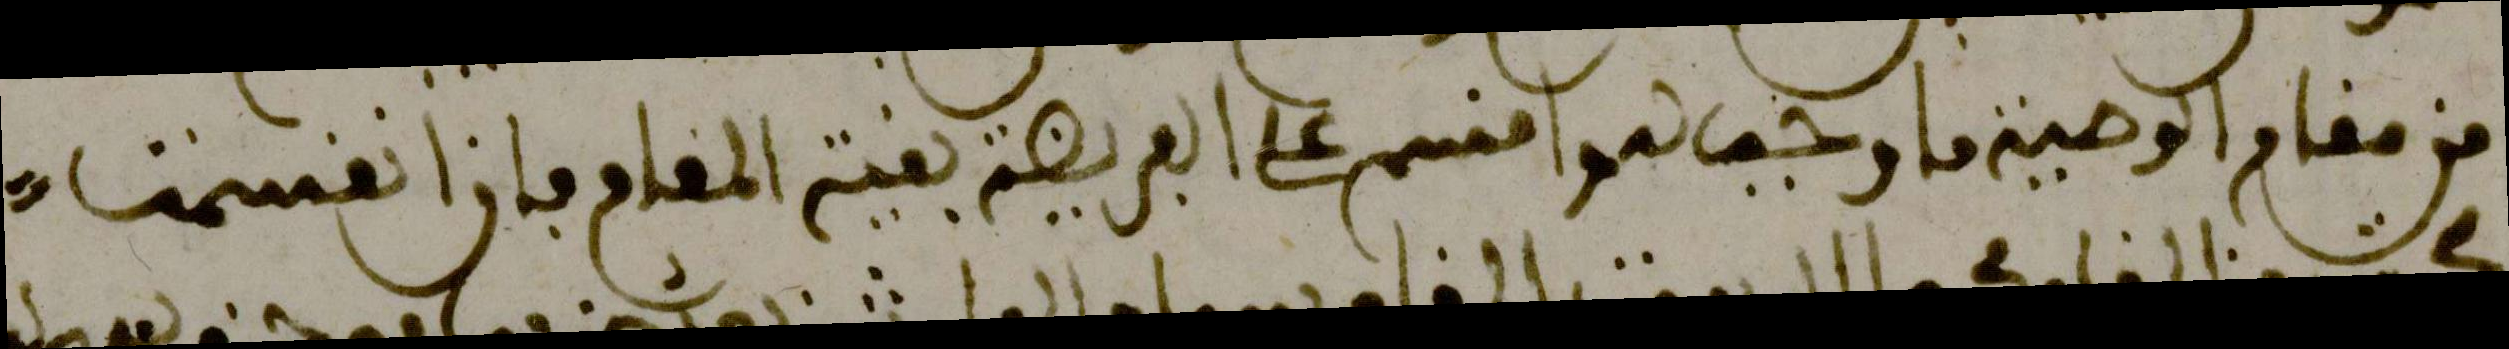من مقام الوصية ما وجب له واقسم على الفريضة بقيه المقام فان انقسمت
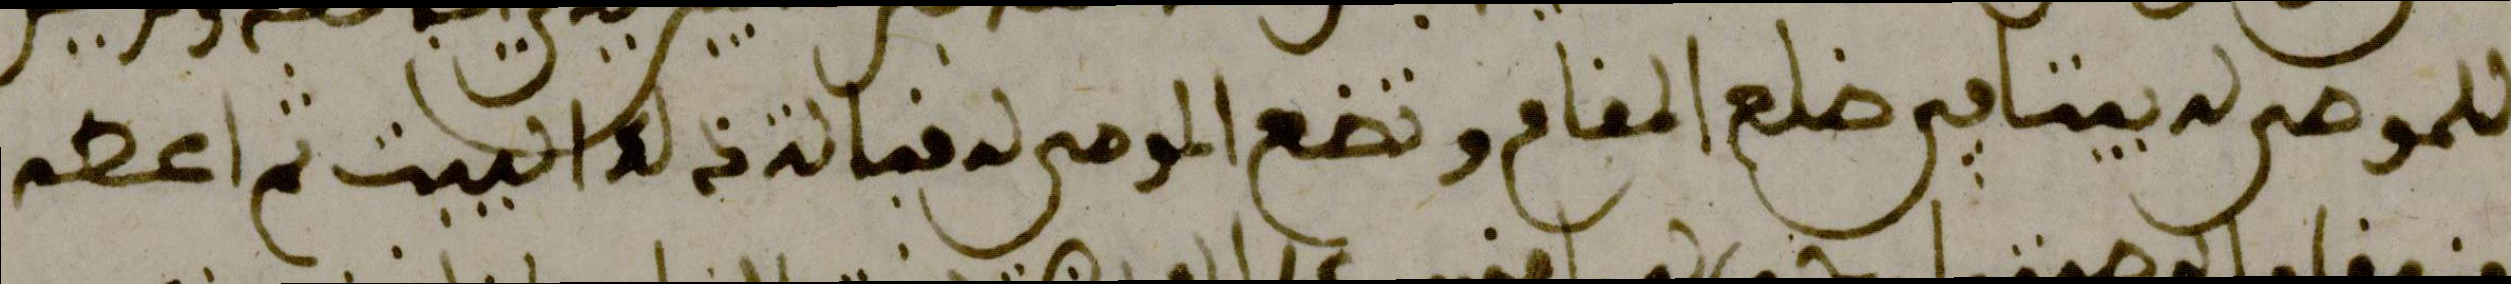للموصى له بيتا في ضلع المقام وتضع الموصى له قبالة ذلك البيت ثم اعطه
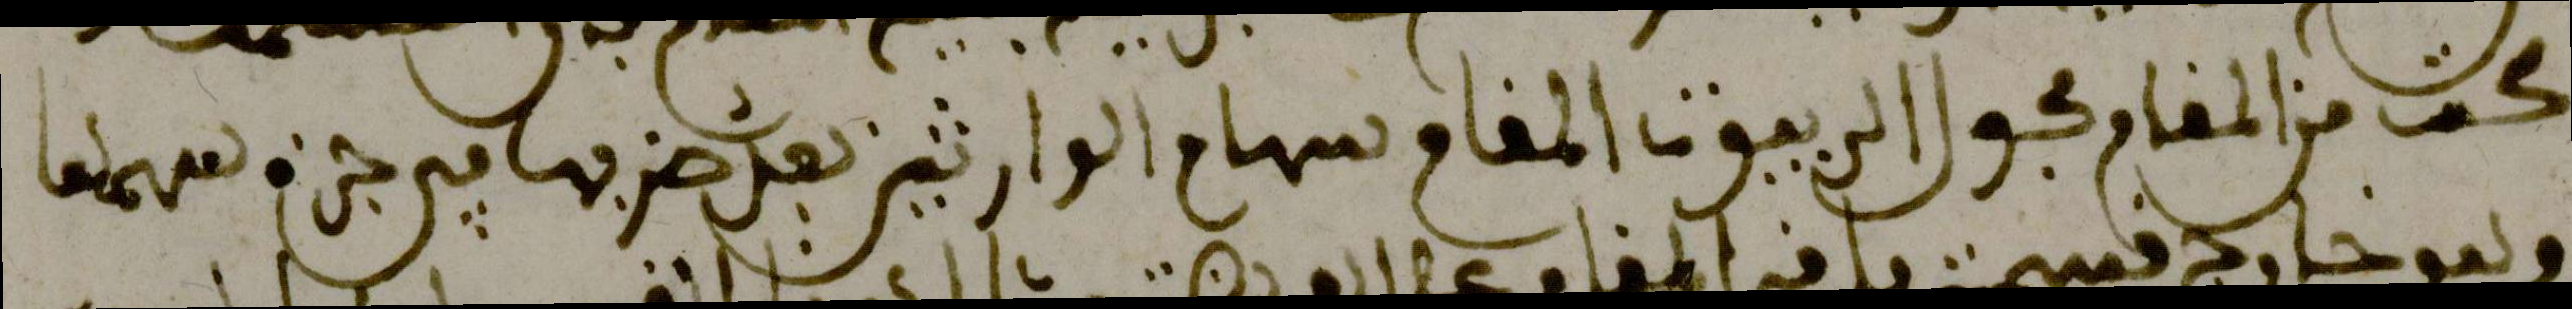صحت من المقام فحول الى بيوت المقام سهام الوارثين بعد ضربها في جزء سهمها
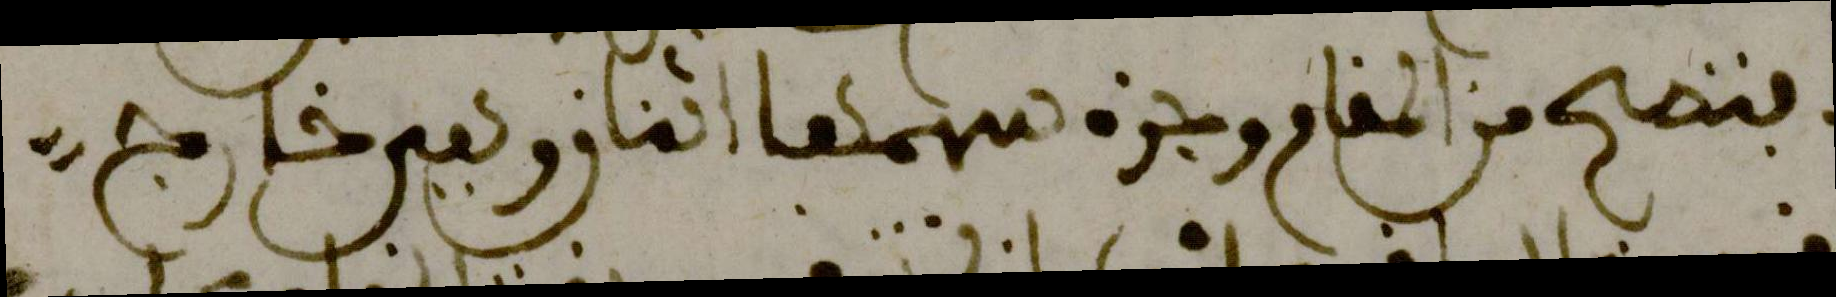فتصح من المقام وجزء سهمها اثنان وهي خارج
